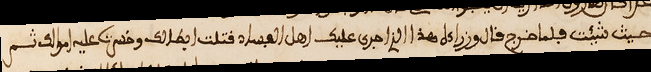حيث شيئت فلما خرج قال وزراءه هذا الذي اجرى عليك اهل الفساد قتلت ابطالك وخسرت عليه اموالك ثم
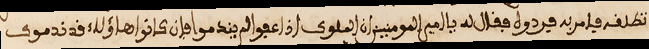تطلقه فامر به فردوه فقال له يا امير المومنية ان الملوك اذا اعفوا لم يندموا فان كانوا هاؤلاء قد ندموك
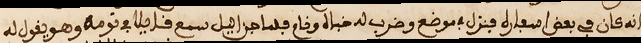انه كان في بعض اسفاره فنزل في موضع وضرب له خباه ونام فلما جن ايل سمع قايلا في نومه وهو يقول له
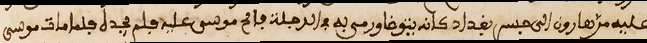عليه مر هارون الى جسر بغداد كانه يتوضا ورمى به في الدجلة فالح موسى عليه فلم يجده فلما مات موسى
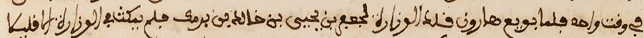في وقت واحد فلما بويع هارون قلد الوزارة لجعفر بن بحيى بن خالد بن برمك فلم يبكث في الوزارة الا قليلا
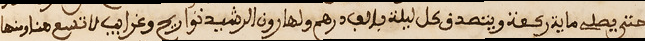حتى يصلى ماية ركعة ويتصدق كل ليلة بالف درهم ولهارون الرشيد تواريح وغرايب لا تسع هنا ومنها
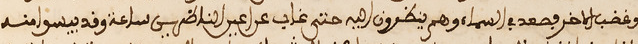وغضب الاخر فصعد في السماء وهم ينظرون اليه حتى غاب عن اعين الناظرين ساعة وقد ييسوا منه
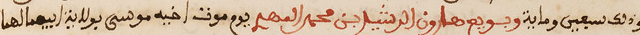ذلك سبعين وماية وبويع هارون الرشيد ب محمد المهدى يوم موت اخيه موسى بولاية ابيهما لهما
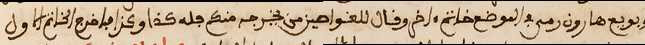وبويع هارون رمى في الموضع خاتم ءاخر وقال للغواصين من يخرجه منكم فله كذا وكذا فاخرج الخاتم الاول
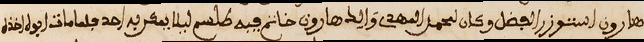هارون استوزر الفضل وكان لمحمد المهدى والد هارون خاتم فيه طلسم ليلا يمكر به احد فلما مات ابوه اخذه
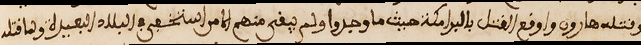وقتله هارون واوقع القتل بالبرامكة حيث ما وجدوا ولم يبقى منهم الا من استخفى في البلاد البعيدة ولما قتله
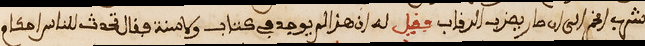شرب الخمر الى ان صار يضرب الرقاب فقيل له ان هذا لم يوجد في كتاب ولا سنة فقال تحدث للناس احكام
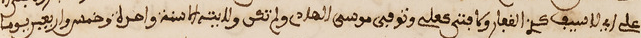على اي لا سيف كذى القفار ولا فتى كعلى وتوفى موسى الهادى ولم تكن ولايته الا سنة واحدة وخمس واربعين يوما
